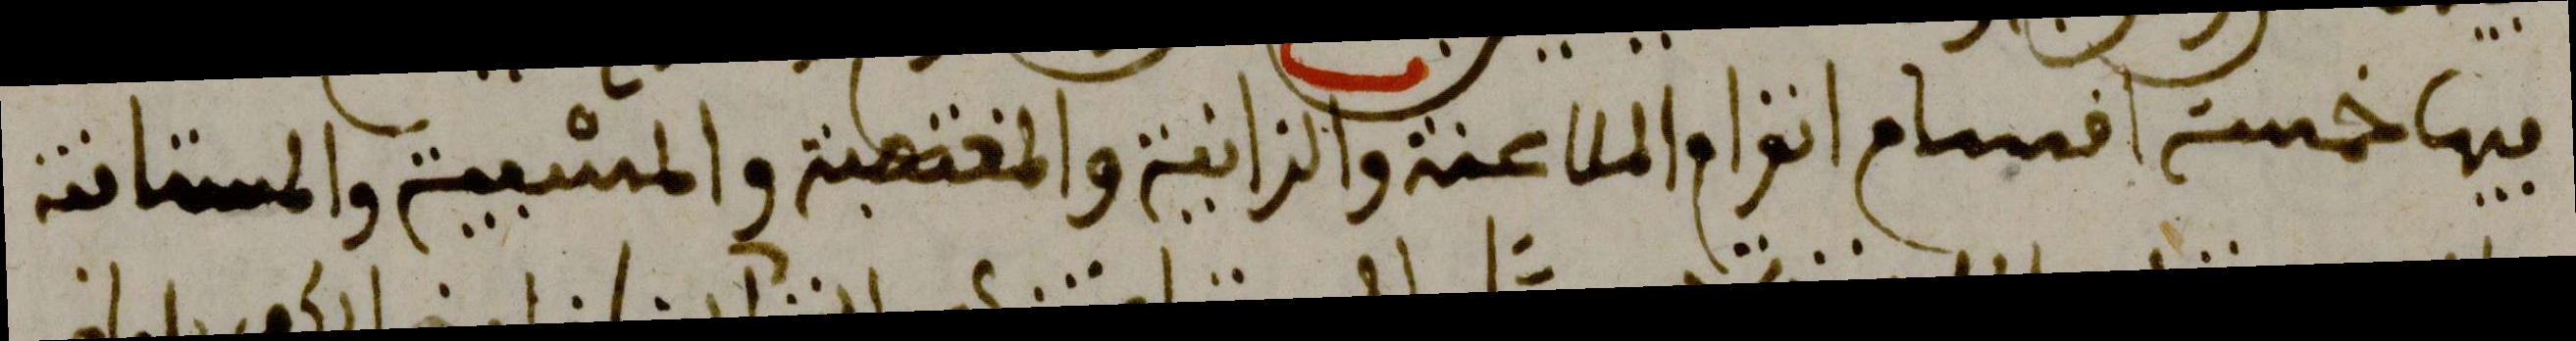فيها خمسة اقسام انواع الملاعنة و الزانية و المغتصبة و المسبية و المستامنة
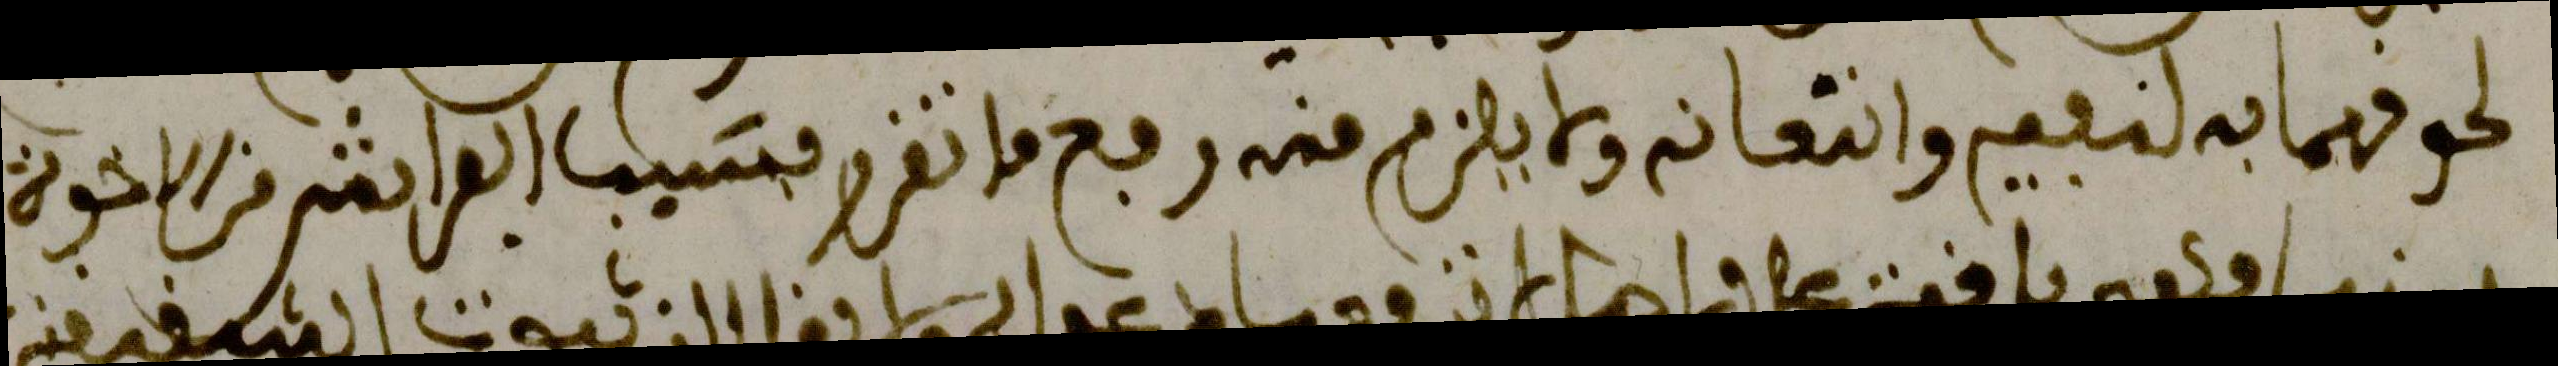لحوقها به لنفيه و التعانه و لا يلزم منه رفع ما تقرر بسبب الفراش من الاخوة
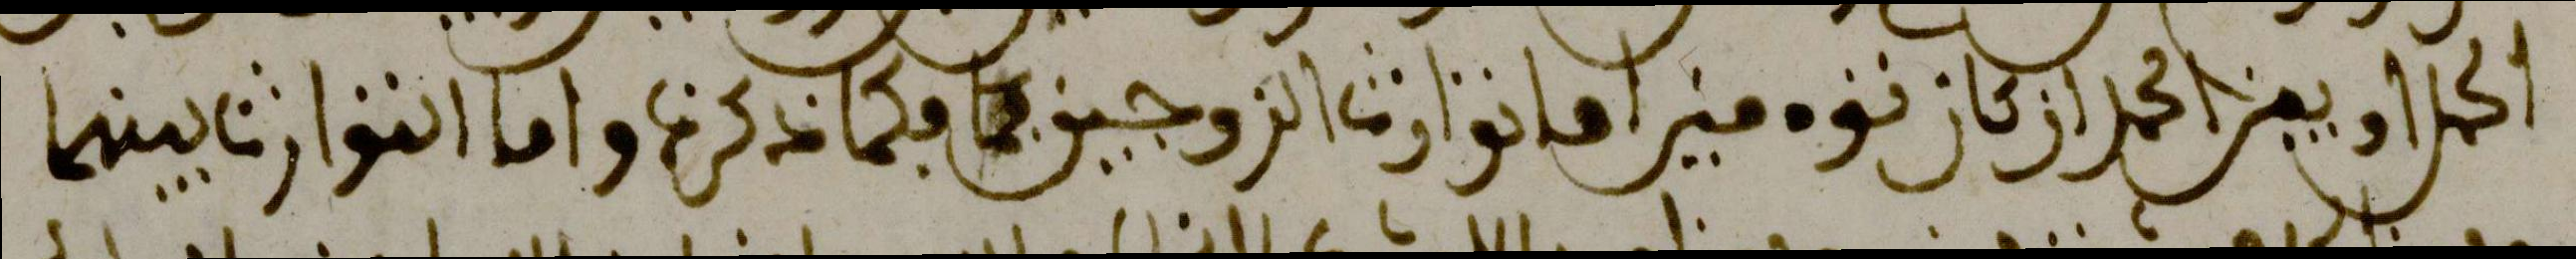الحمل و يبن الحمل ان كان توءمين اما توارث الزوجين فكما ذكرن و اما التوارث بينهما
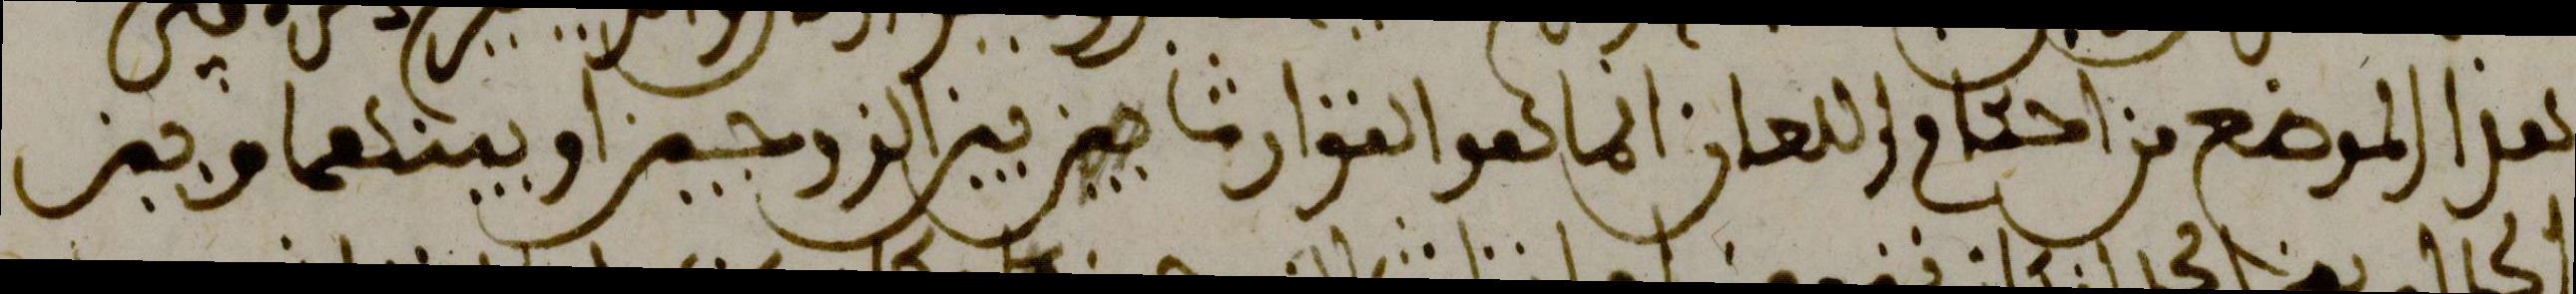هذا الموضع من احكام اللعان انما هو التوارث بين بين الزوجين او بينهما و يبن
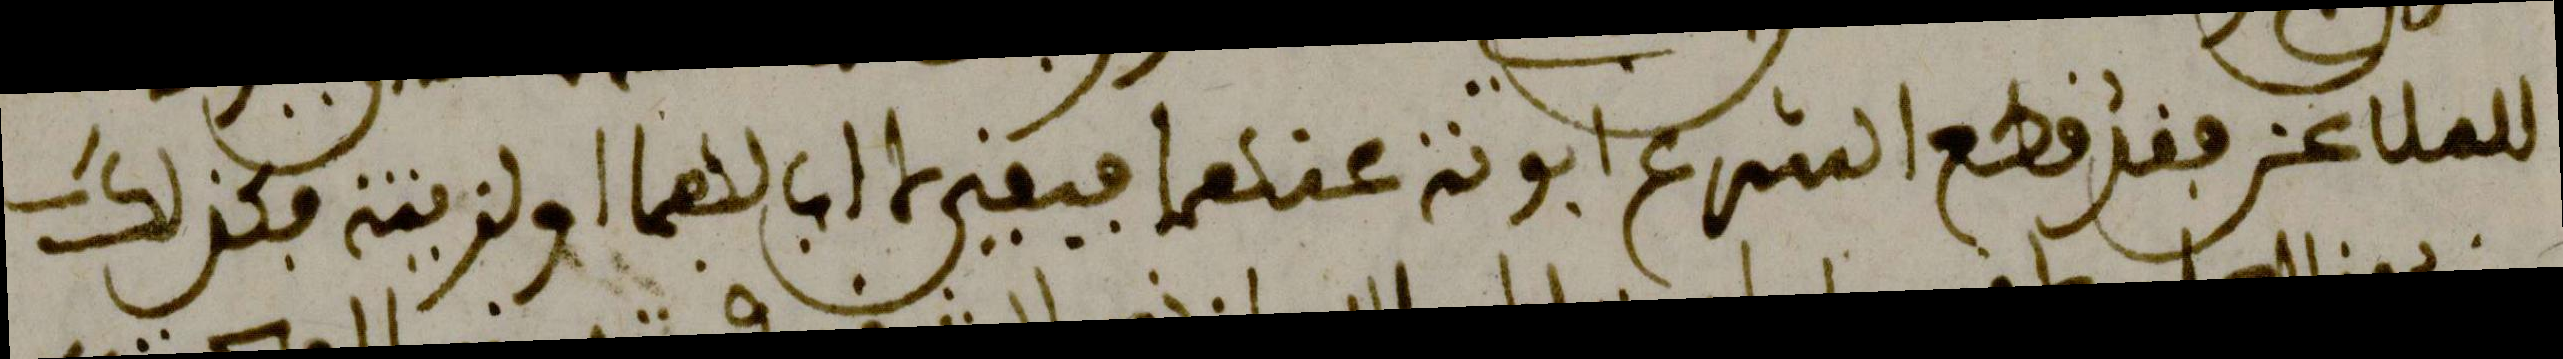للملاعن فقد قطع الشرع ابوته عنهما فبقي لا اب لهما او لزنية فكذلك
